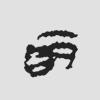丙
